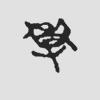事
